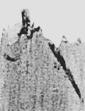母
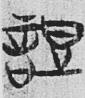○（誅）
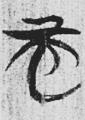而
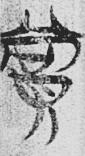賞
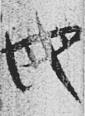母
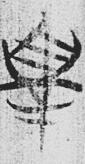辠
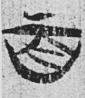百
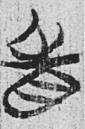眚（姓）
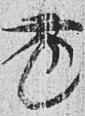而
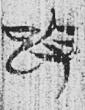改
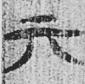亓
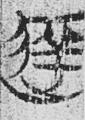𨒫（將）
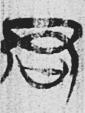君
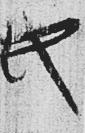女（如）
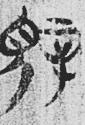親
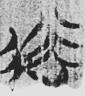○（率）
